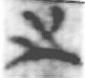之
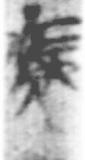駟
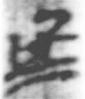爲
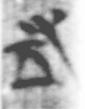○（右）
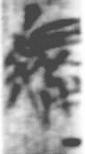○（服）
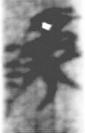鄭
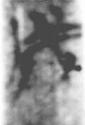成
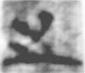之
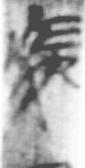駟
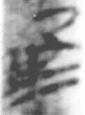爲
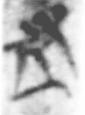○（右）
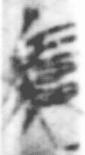驂
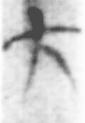大
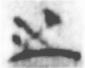之
